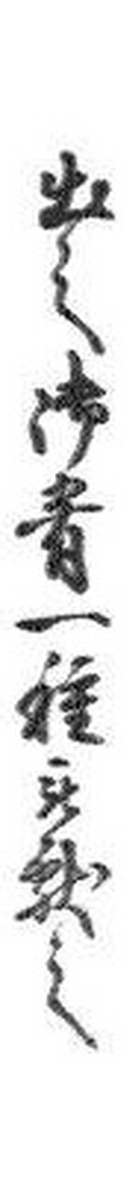出之御肴一種被献之
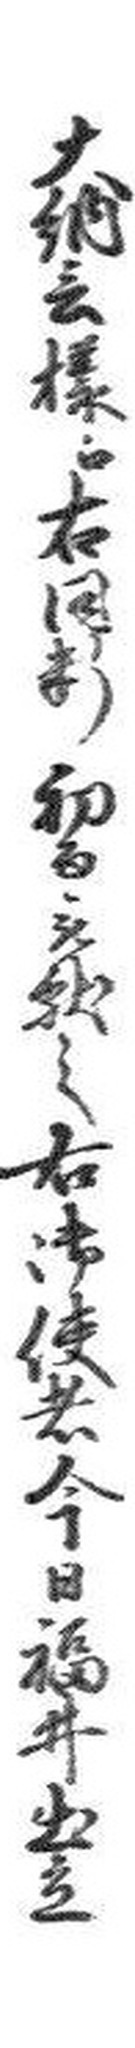大納言様江右同断初而被献之右御使者今日福井出立
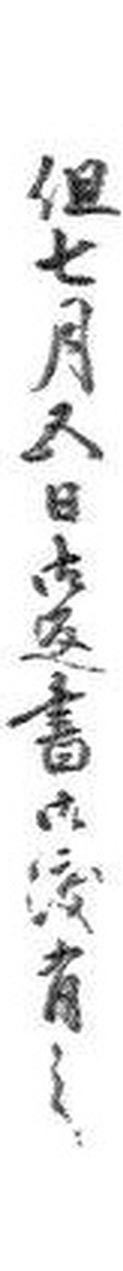但七月五日御返書御渡有之
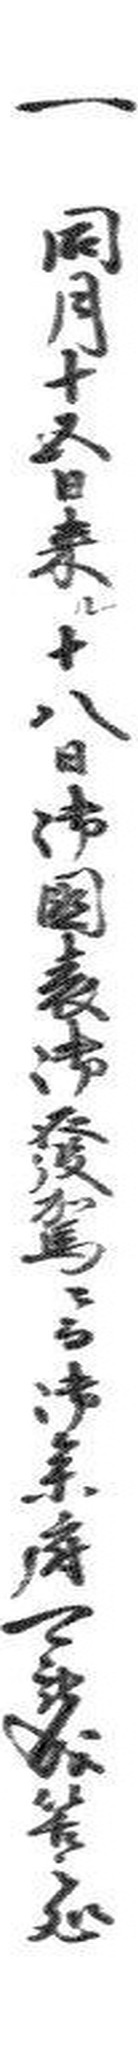一同月十五日来ル十八日御国表御発駕ニ而御参府可被成筈之処
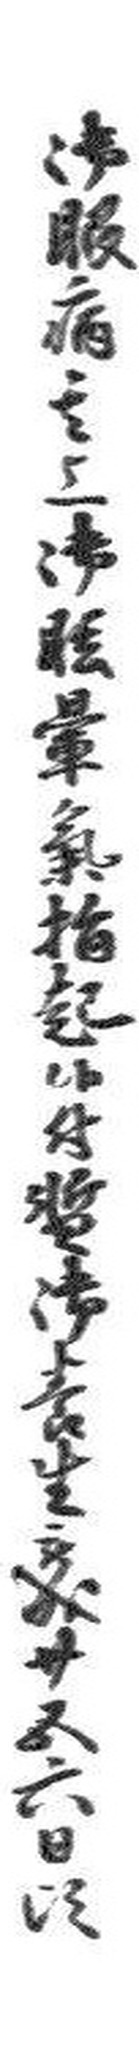御眼病其上御眩暈気指起候付暫御養生被成廿五六日頃
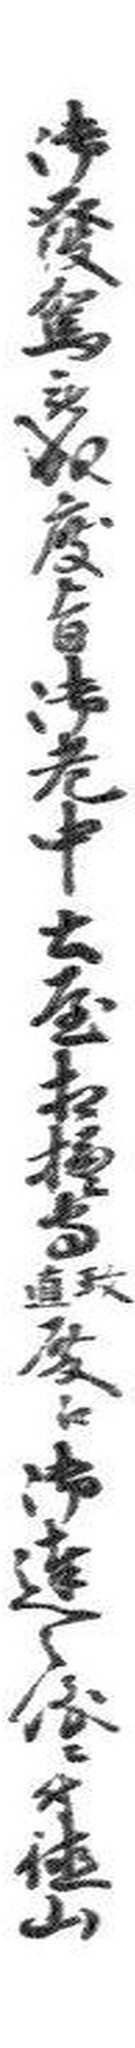御発駕被成度旨御老中土屋相模守政直殿江御達之儀ニ付徳山
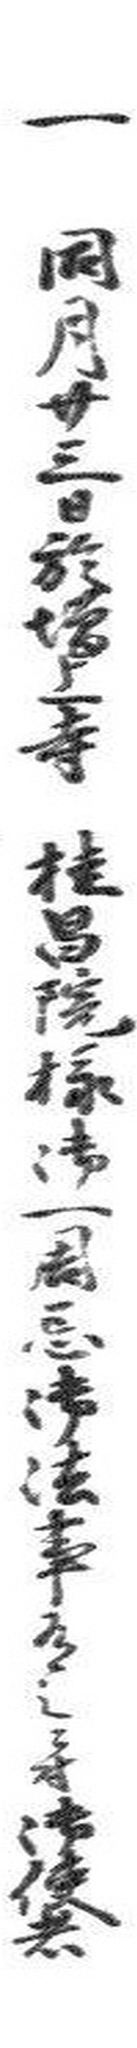一同月廿三日於増上寺桂昌院様御一周忌御法事有之二付御使者
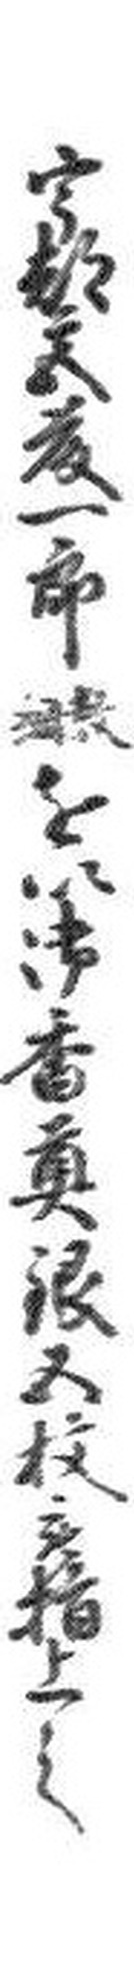宇都宮藤一郎教綱を以御香奠銀五枚被指上之

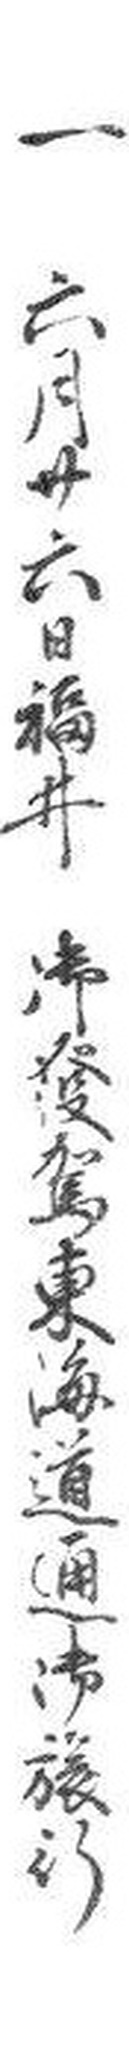一六月廿六日福井御発駕東海道通御旅行
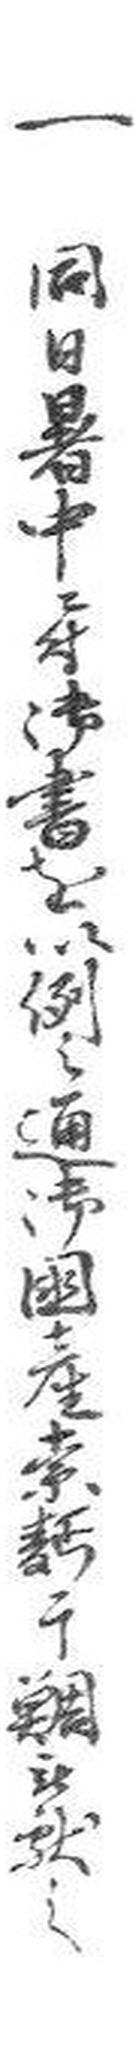一同日暑中ニ付御書を以例之通御国産索麪干鯛被献之
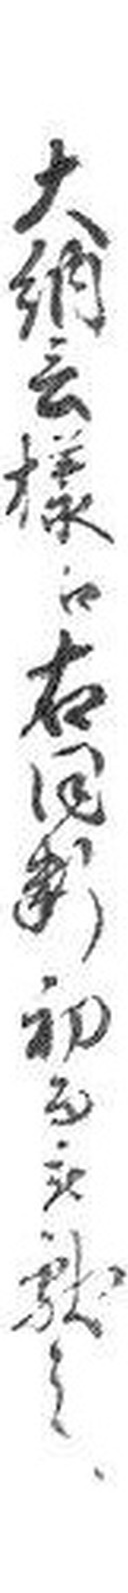大納言様江右同断初而被献之
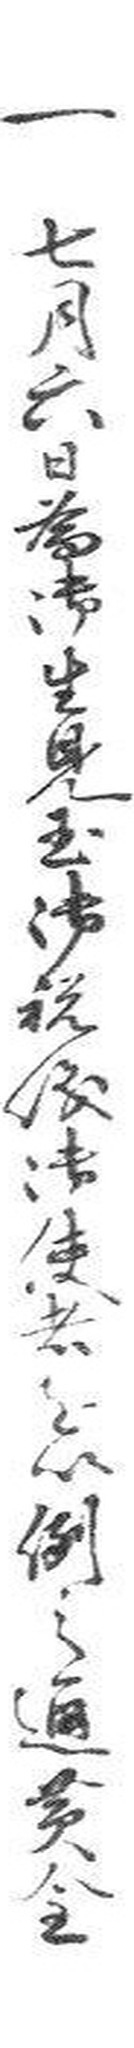一七月六日為御生見玉御祝儀御使者を以例之通黄金
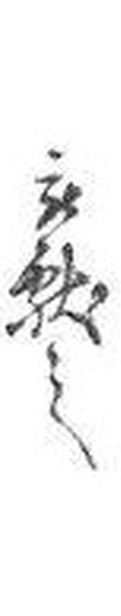被献之
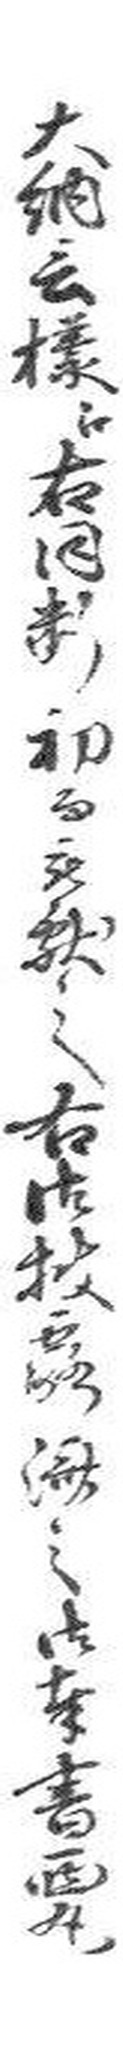大納言様江右同断初而被献之右御披露済之御奉書西丸
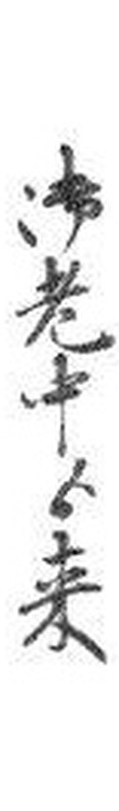御老中ゟ来
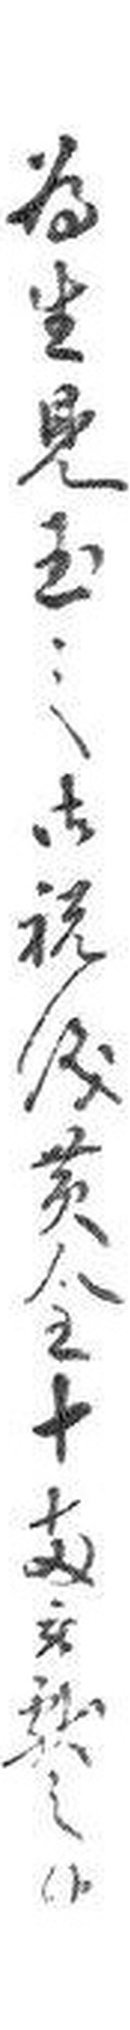為生見玉之御祝儀黄金十両被献之候
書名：家譜 二十四 吉品公 従宝永三年到同五年
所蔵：福井県文書館 Fukui Prefectural Archives
